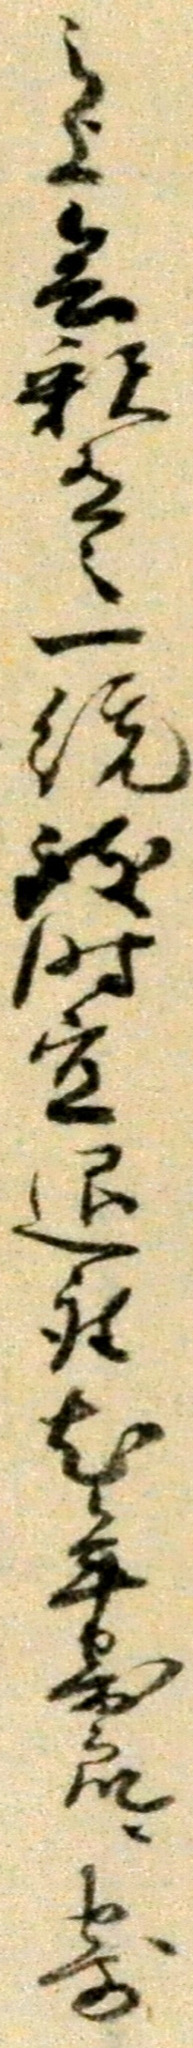之上会釈有之一統致時宜退座尤年寄衆ニ寄
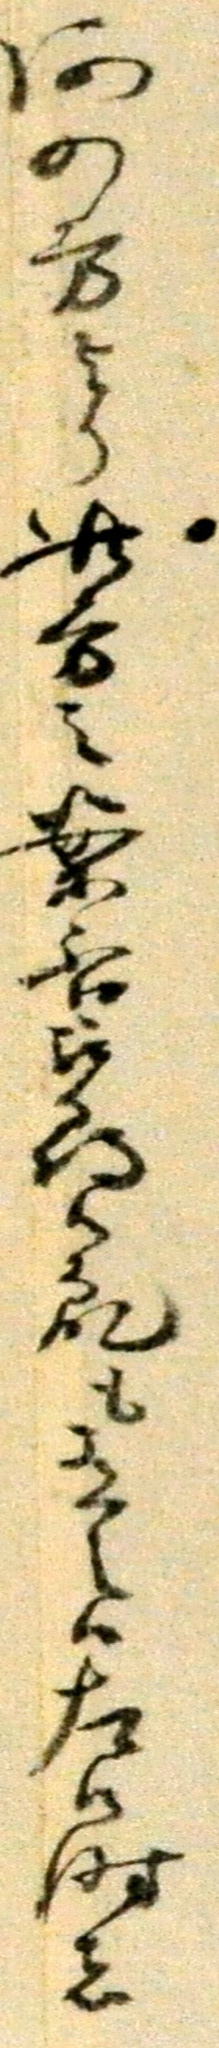何の方より此方之安否被尋候衆も有之候左候時者
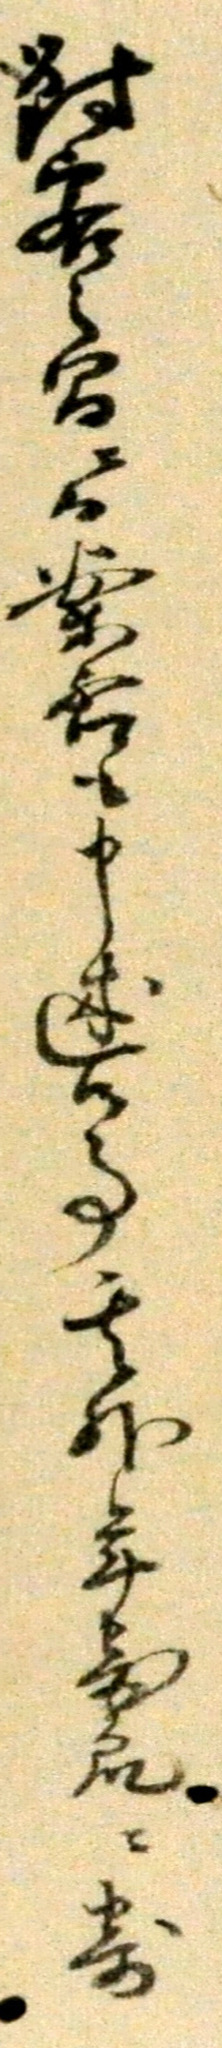対客之間ニ而安否も申述候事其外年寄衆ニ寄
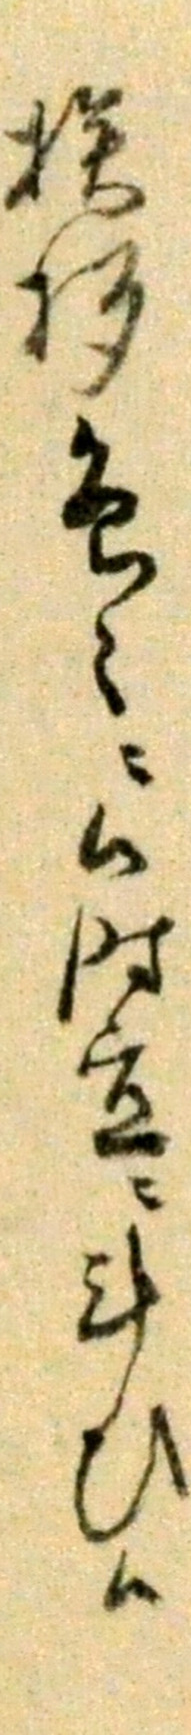挨拶色々ニ候時宜ニ計ひ候
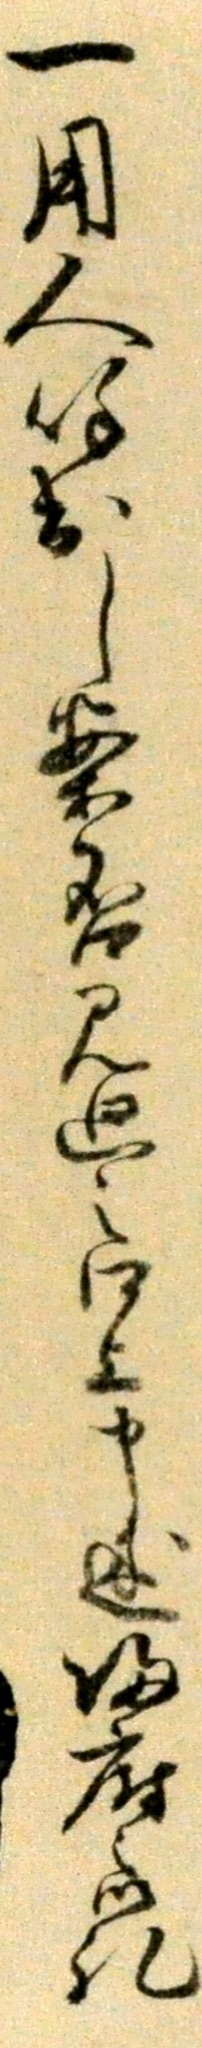一用人呼出し安否見迴之口上申述帰府之御礼
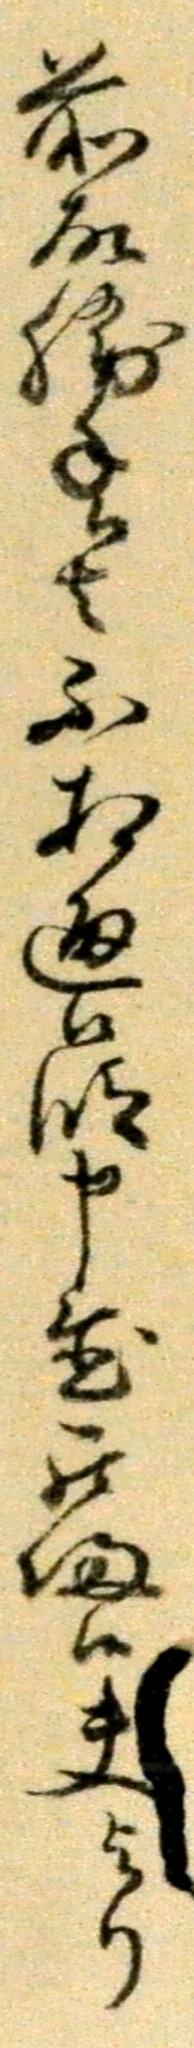前故勝手江者不相通候段申置罷帰候夫より
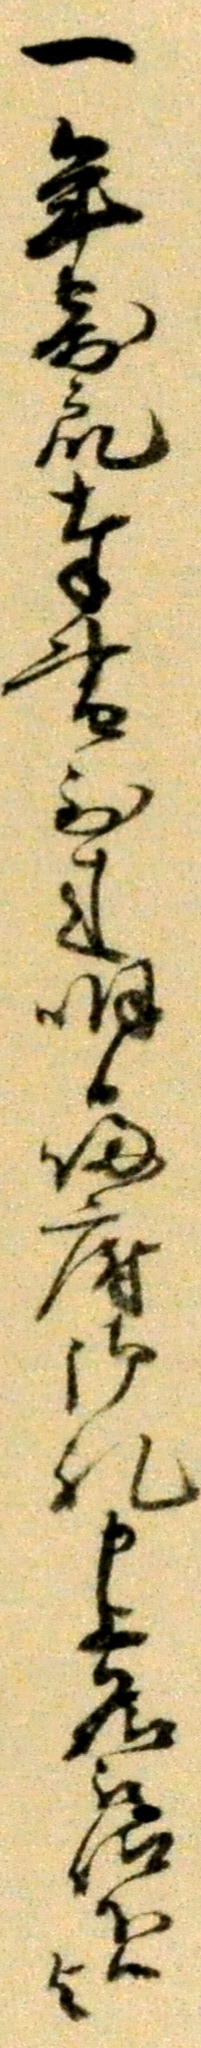一年寄衆奉書到来明日帰府御礼申上候様被仰下候与
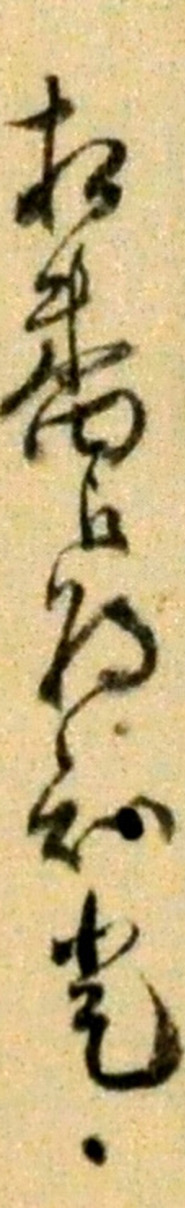相番江為知登
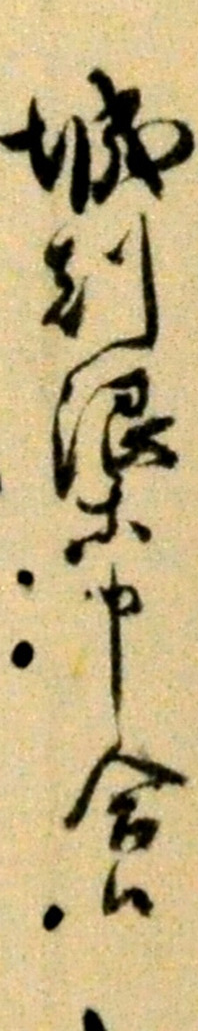城刻限等申合
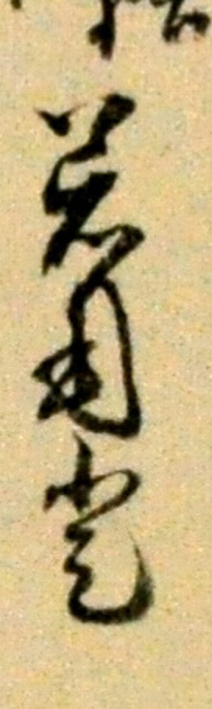着用登
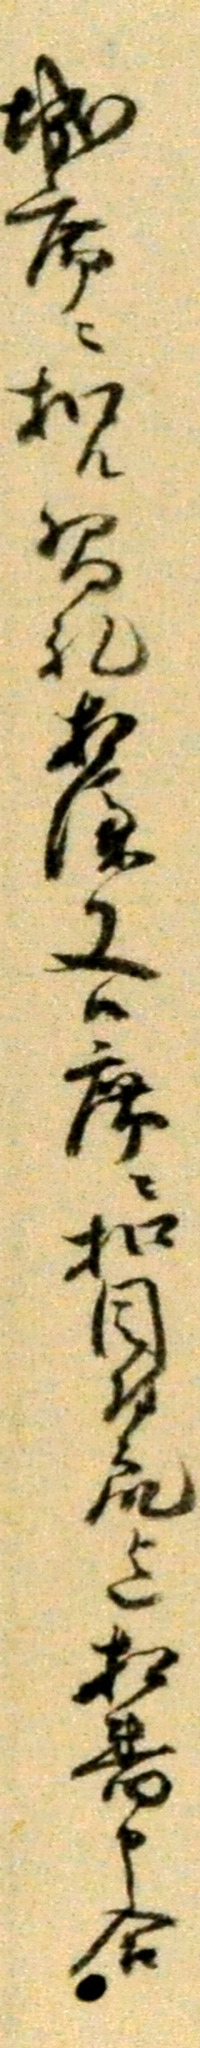城席ニ扣ㇽ間礼相済又候席ニ扣目付衆迄相番申合
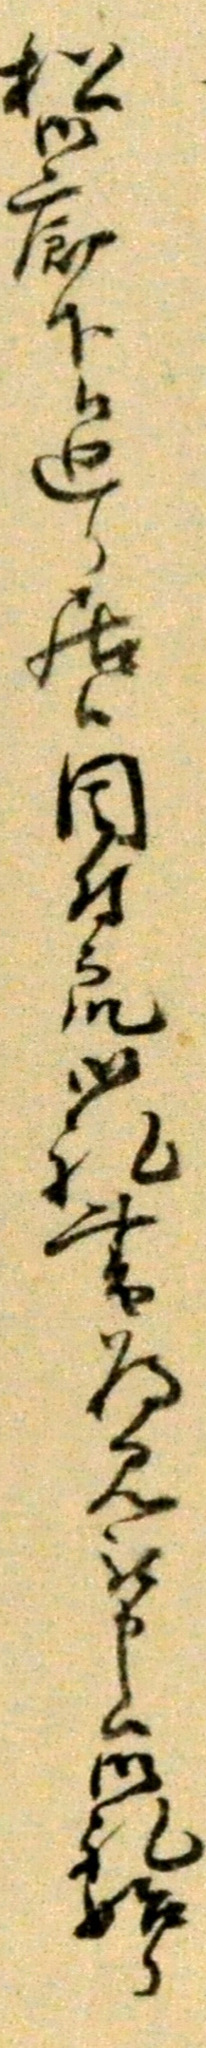松御廊下江通り居候目付衆御礼書為見被申上御礼給り
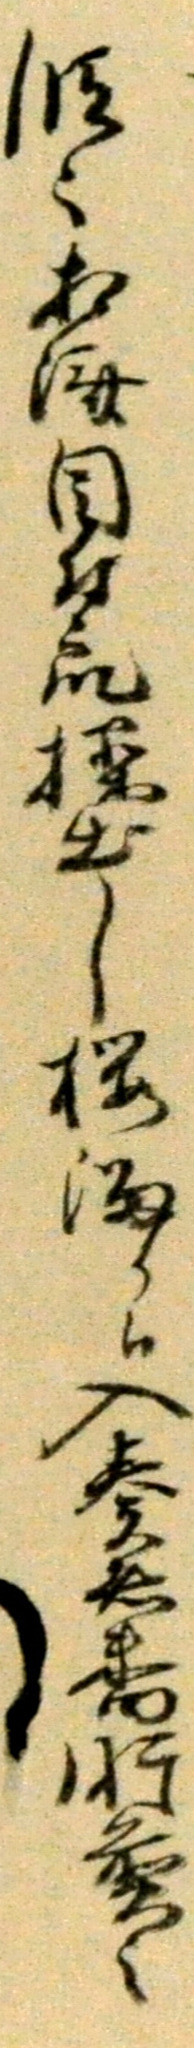段々相済目付衆操出し楼溜り江入り奏者肝煎之
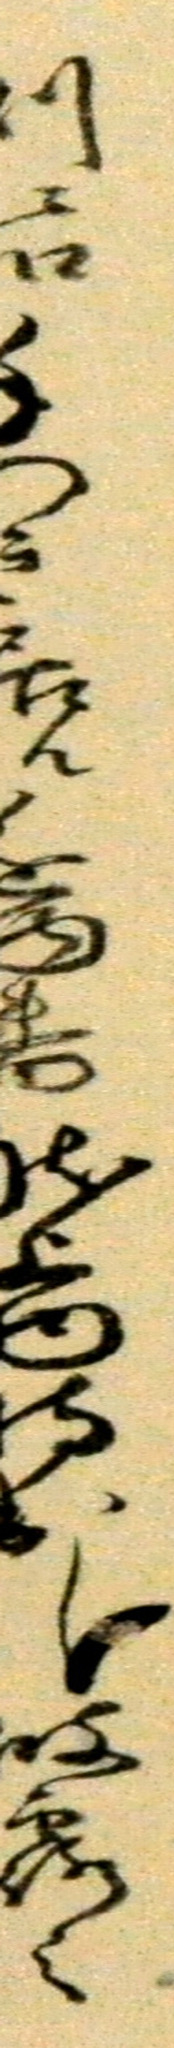側ニ扣手つき居ㇽ進物番献上物持出し披露之

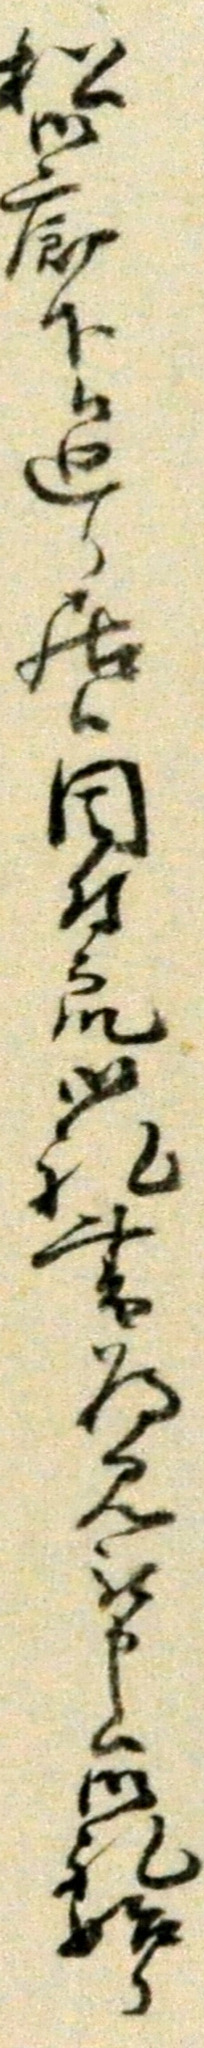松乃廊下江廻り居候目付衆御礼書為見被申候給り
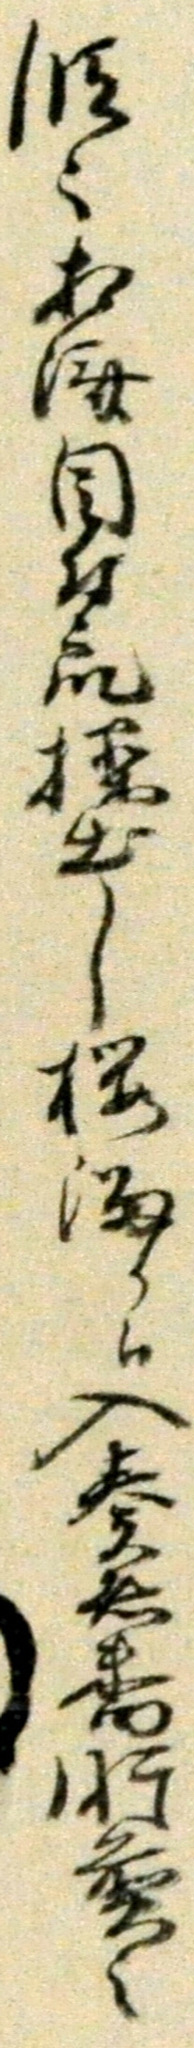段々相済目付衆操出し楼溜り江入奏者番肝煎之
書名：大阪加番関係諸書留〔一括〕
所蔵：伊那市立高遠町図書館・合同会社AMANE
